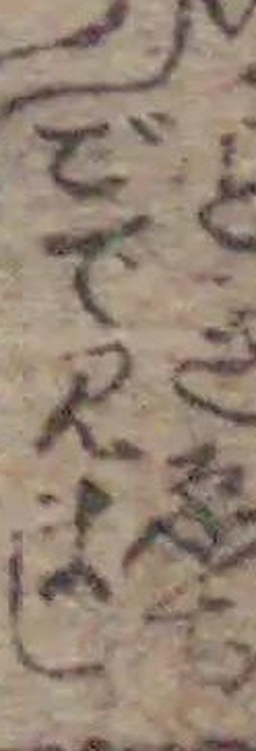ごでみまし
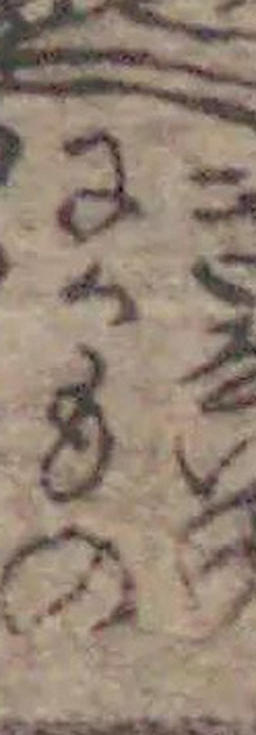にかもの
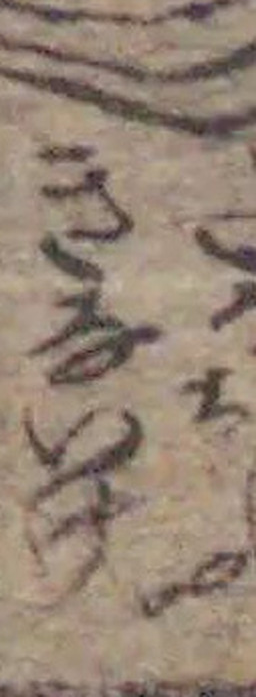きないけ
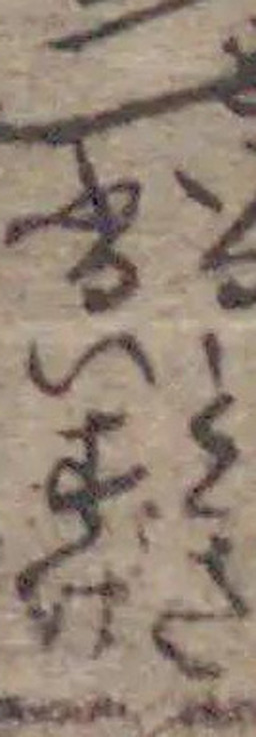ふるいすげ
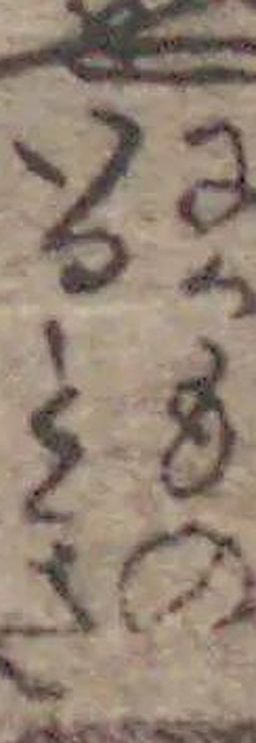いるとき
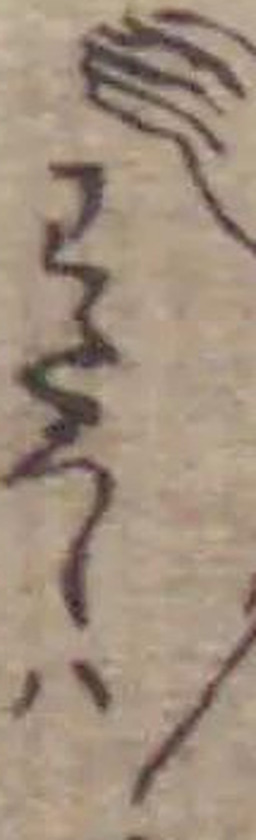わたくしは
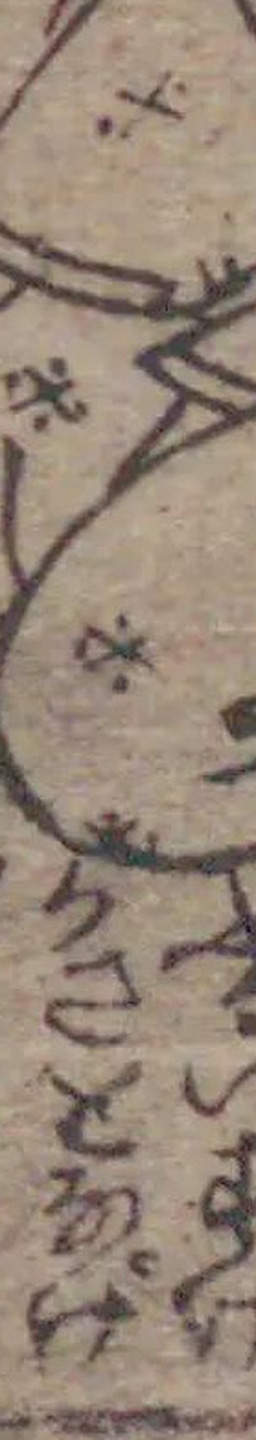かさをなげ
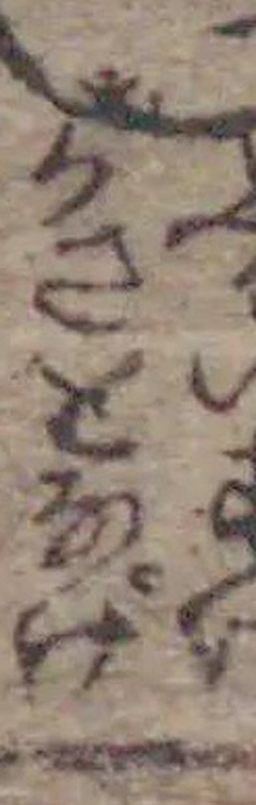かさをなげ
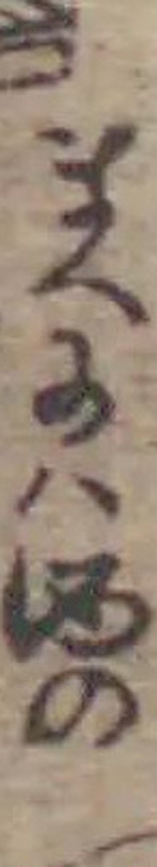まへには酒の
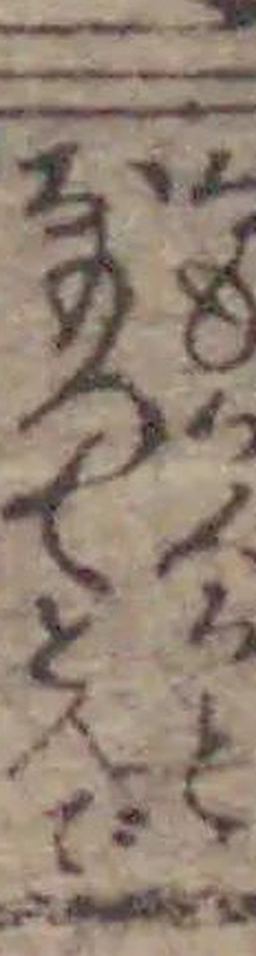おもつてとんで
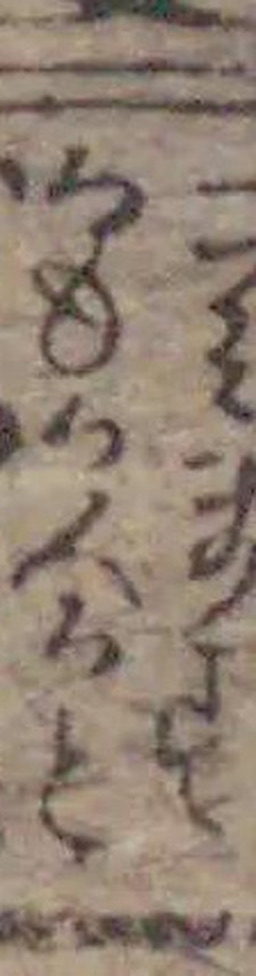かもか人かと
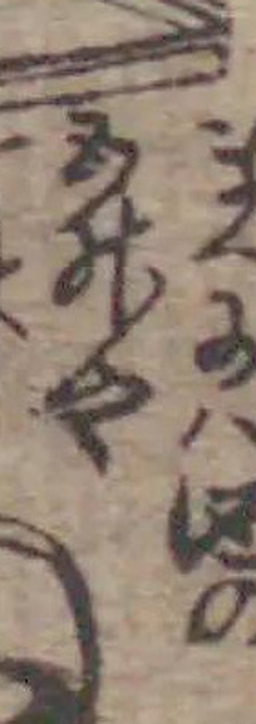五升や
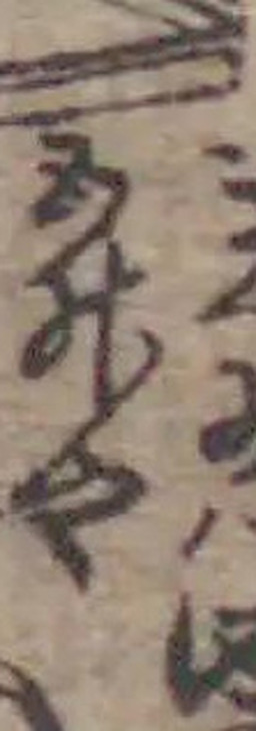五升や
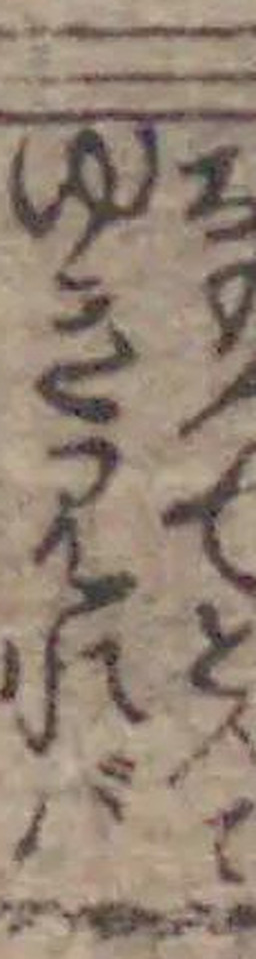ゆき見れば
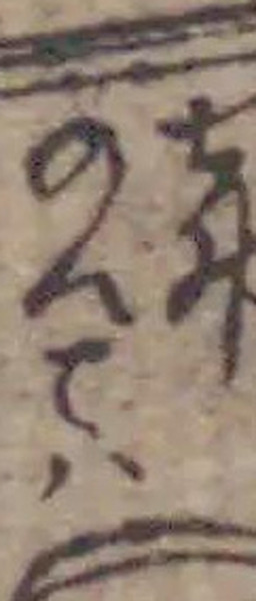のんては
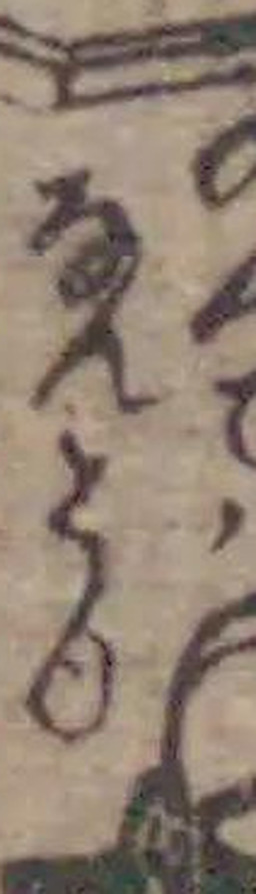なんとも
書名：虚言弥二郎傾城誠 3巻
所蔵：国立国会図書館 National Diet Library, JAPAN
